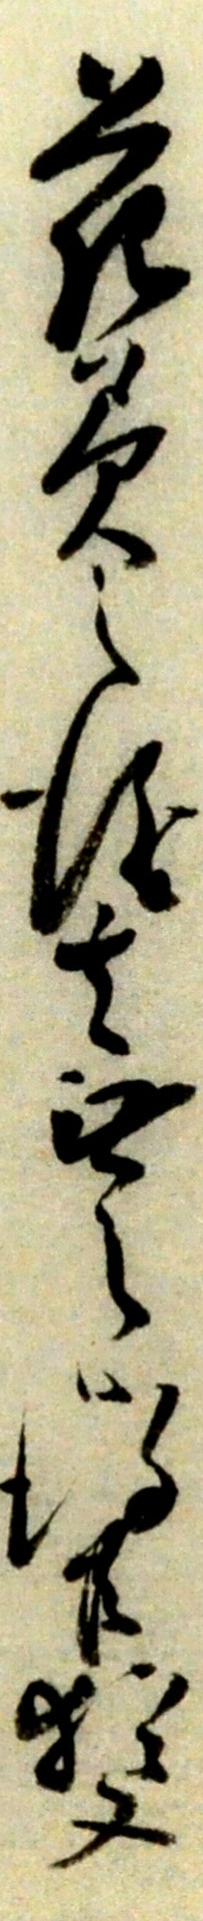花美之儀は無之候得共猶又
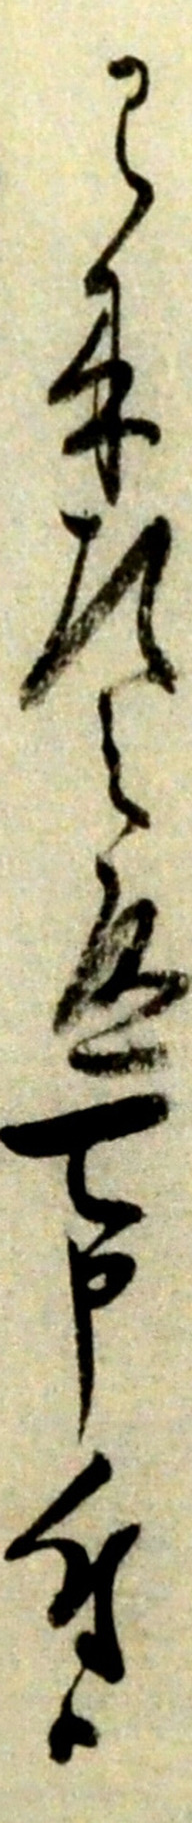已来左之通可申付候

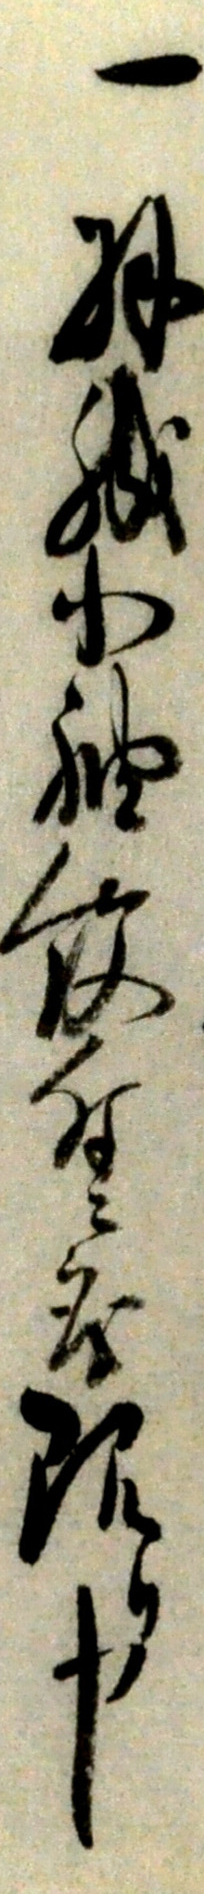一羽織小袖紋付にも限り申
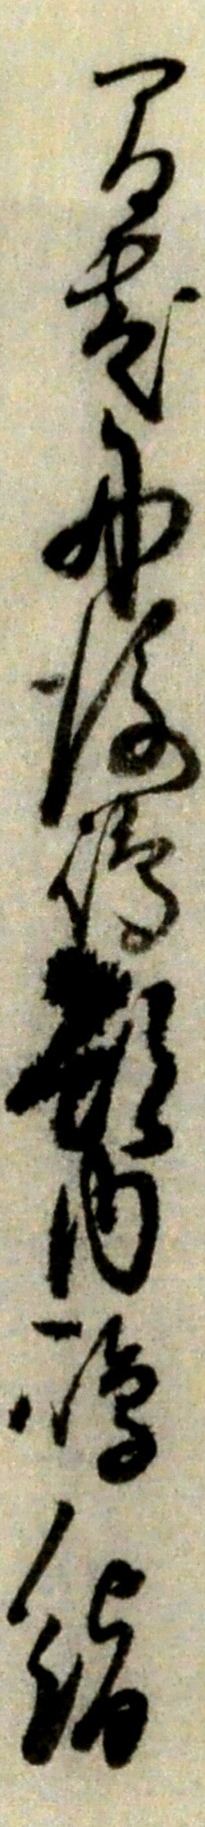間敷丹後嶋郡内嶋絹
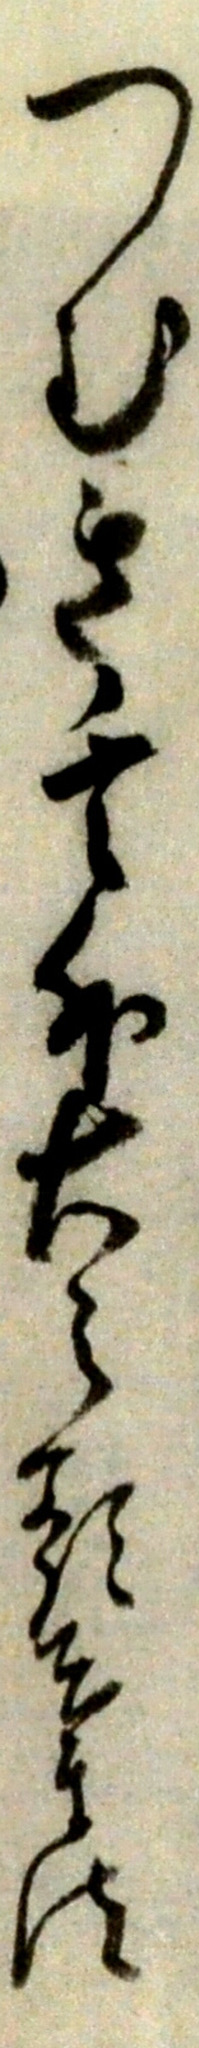つむき其外右之類そまつ
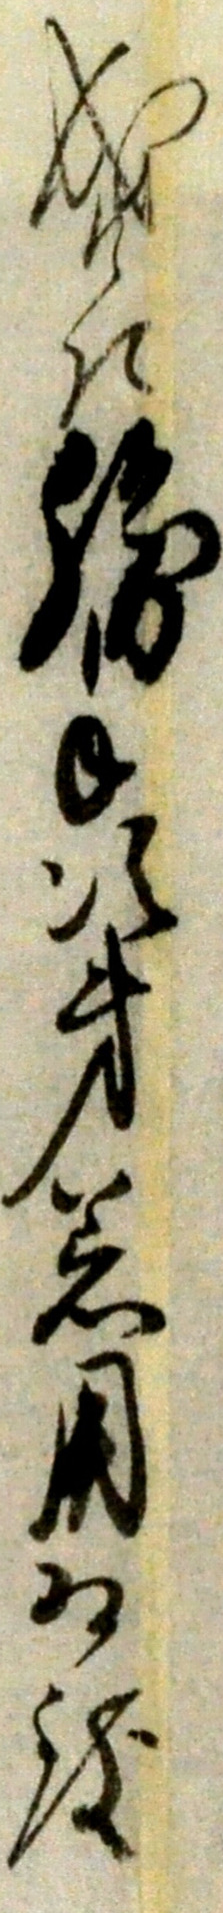成候は勝手次第着用為致
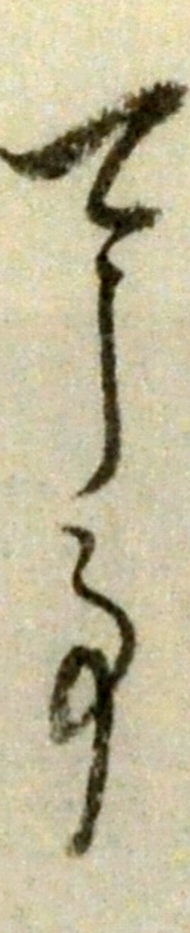可申事
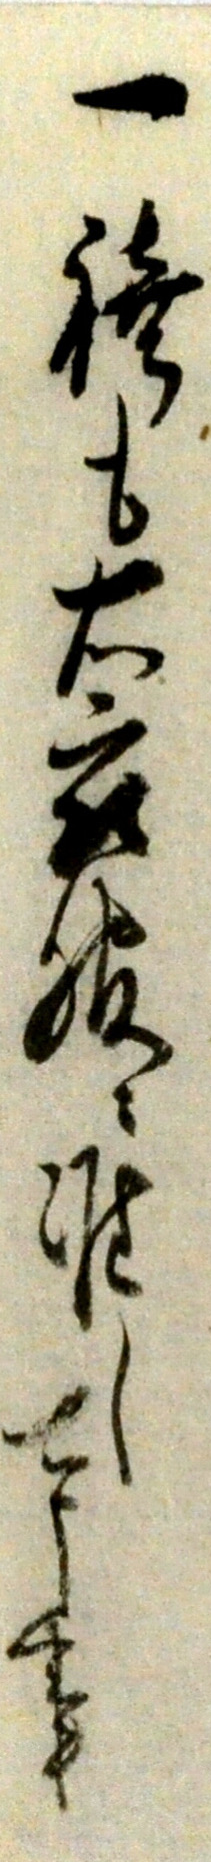一袴も右衣服に准し可申事
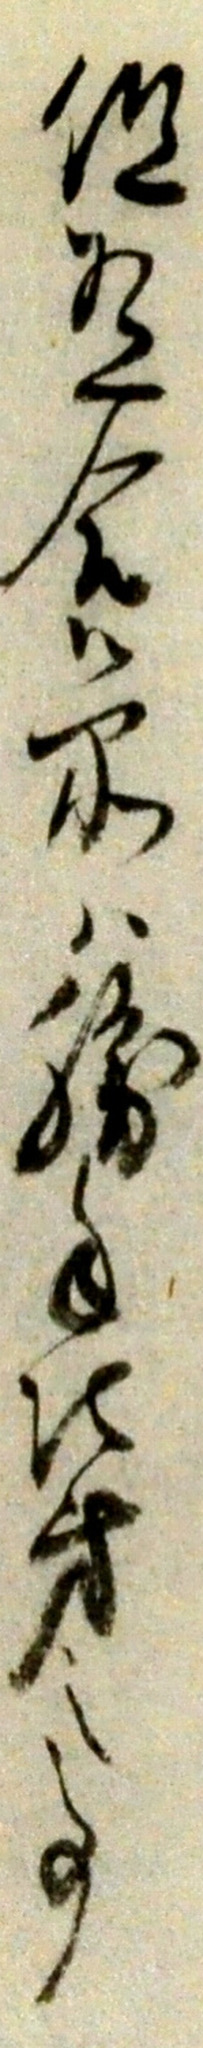但有合候品は勝手次第之事
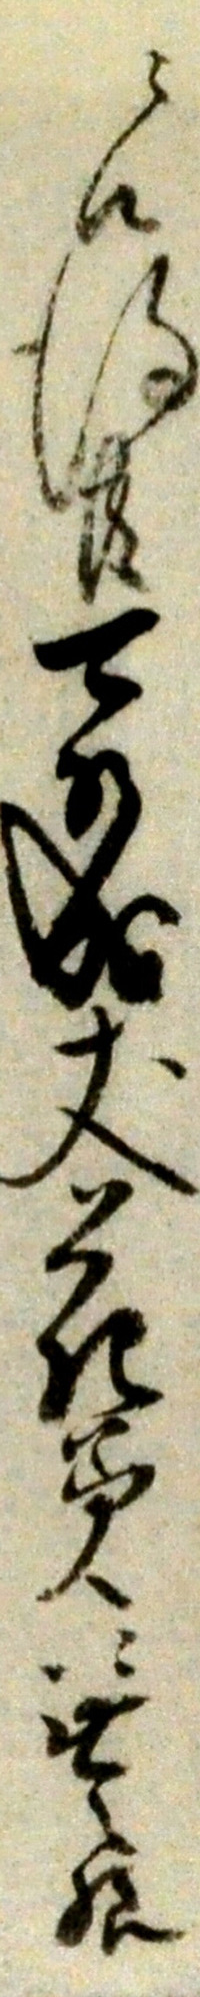に候得共可被成丈花美に無之様
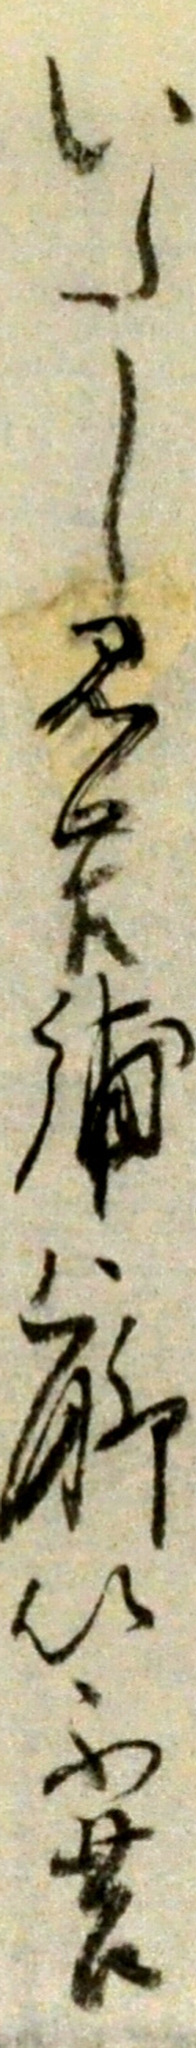いたし見苦鋪は聊以不苦
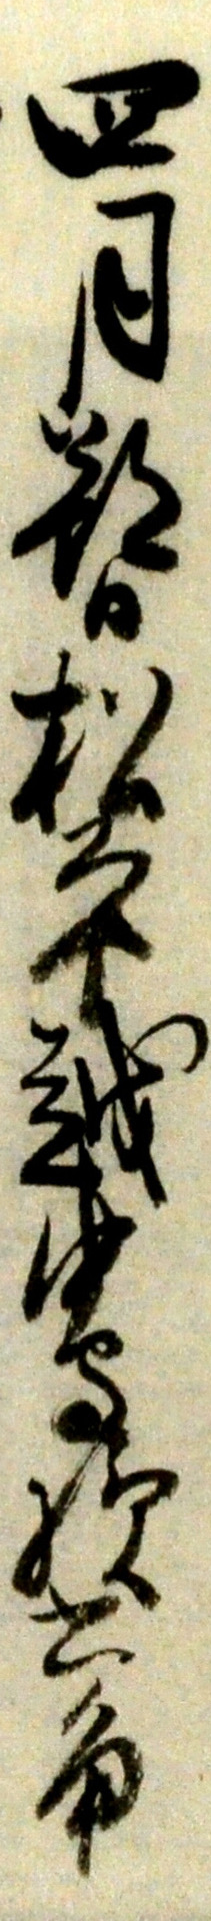四月朔日松平越中守様六角
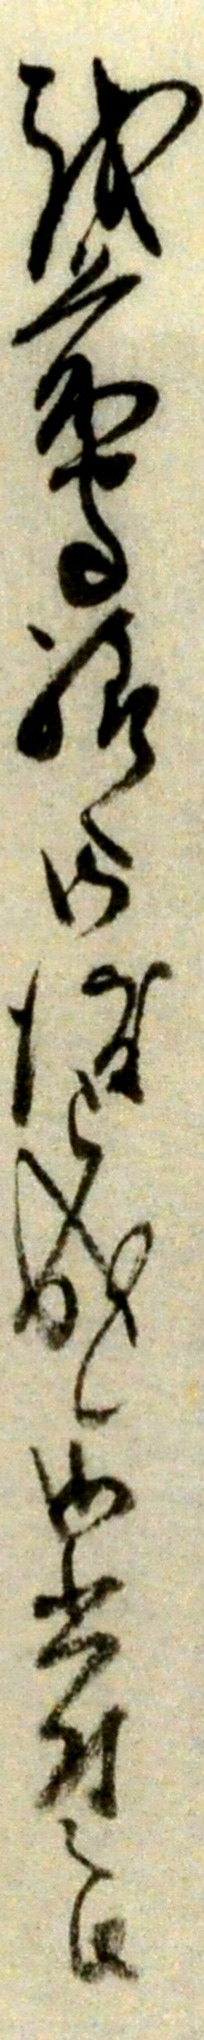越前守様へ御渡被成候御書付之由
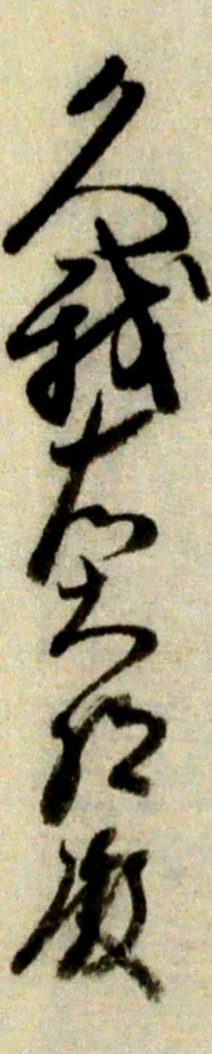久我右大将殿
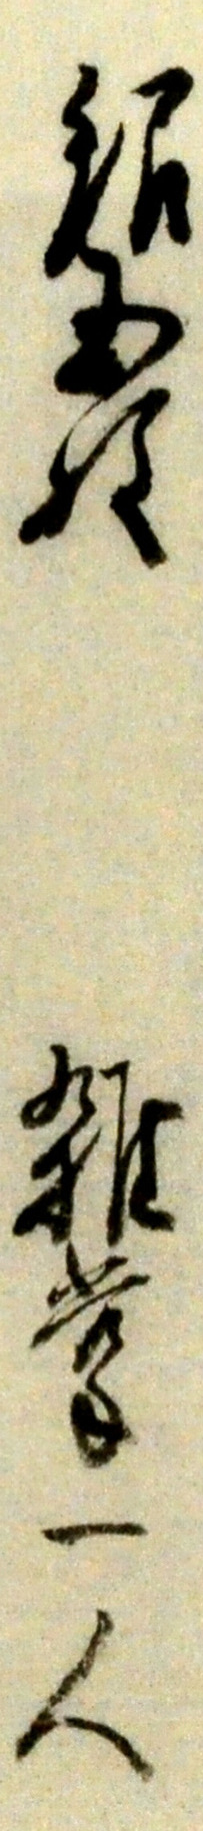銀五枚雑掌一人
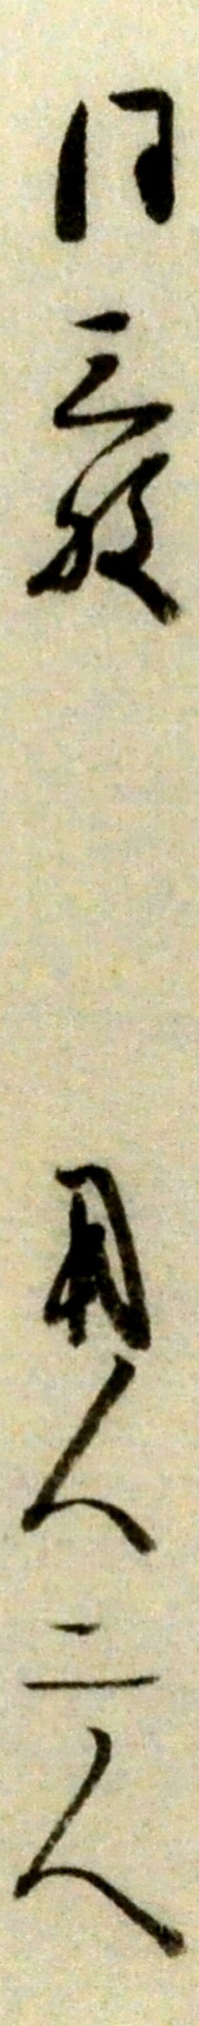同三枚用人二人
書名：申合帳〔一括〕
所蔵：伊那市立高遠町図書館・合同会社AMANE
